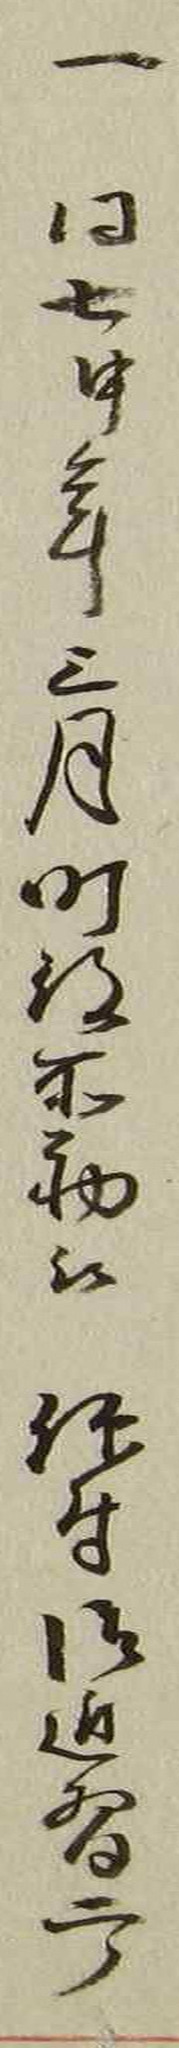一同七申年三月町役所勤被仰付御近習二ノ
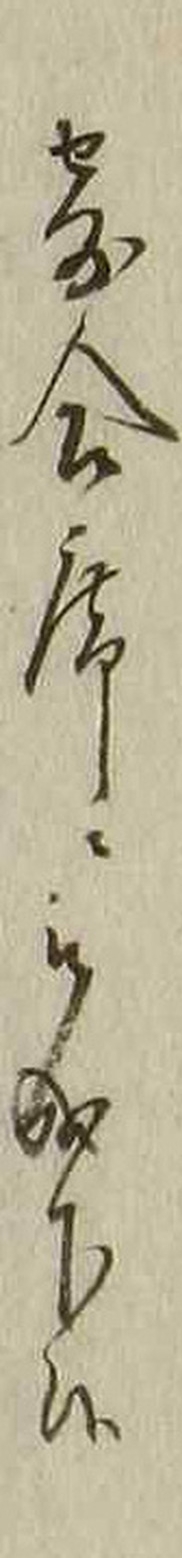寄合席ニ被成下候
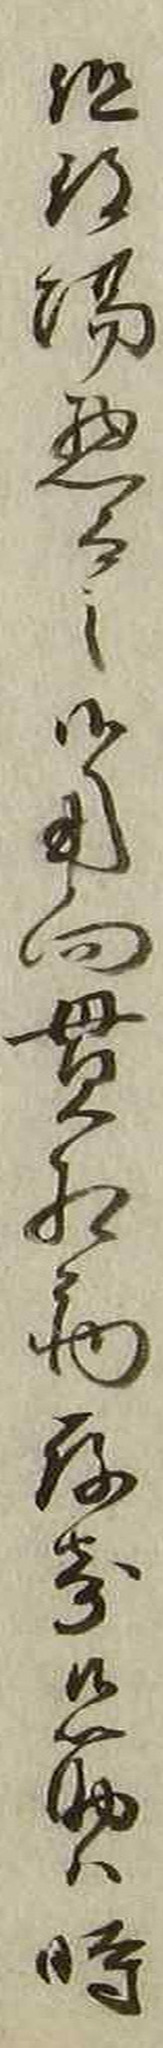但役場惣而之御用向貫相勤存寄候筋ハ時
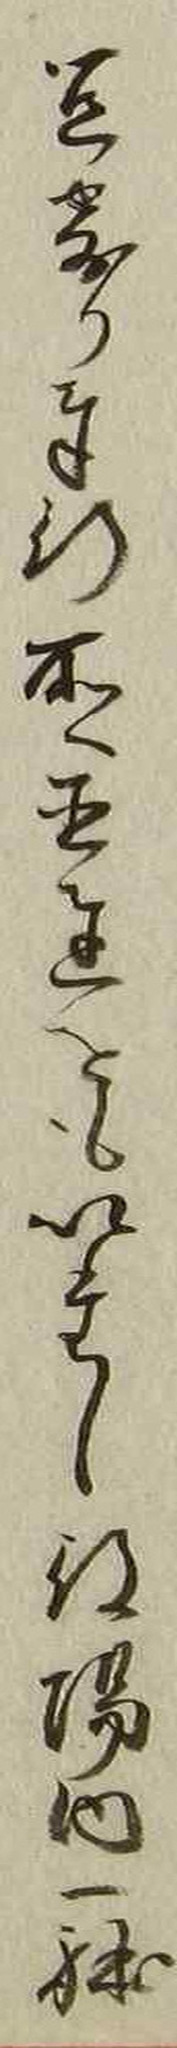宜寄り奉行所へ直達をもいたし役場内一体
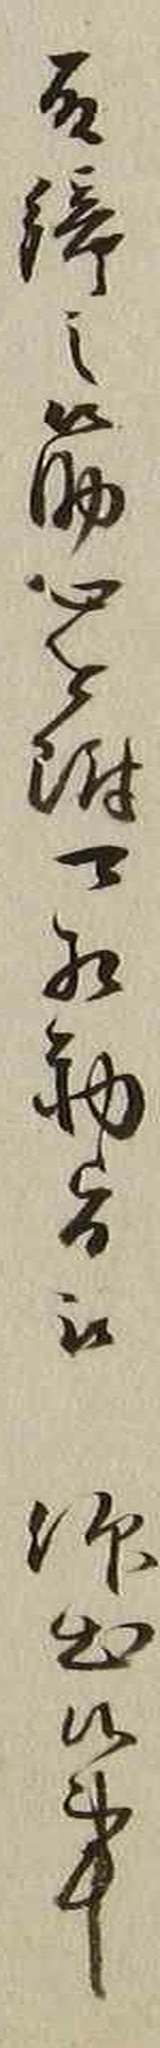取締之筋心を附可相勤旨被仰出候事
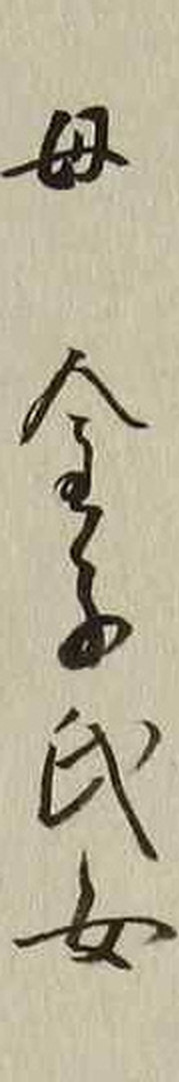母金子氏女
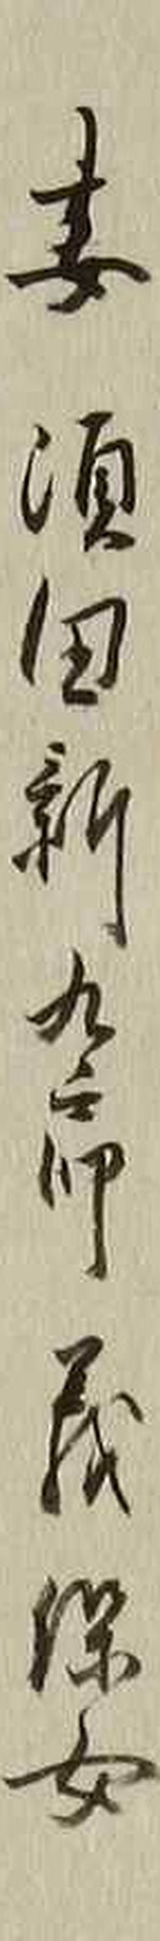妻須田新九郎茂保女
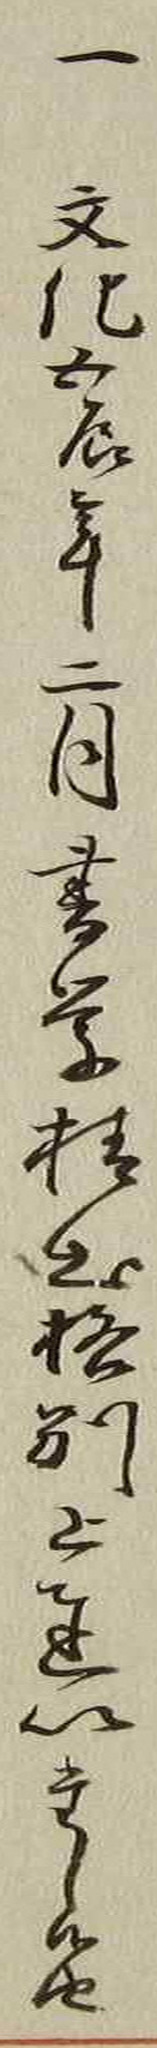一文化五辰年二月書学精出格別上達いたし候由
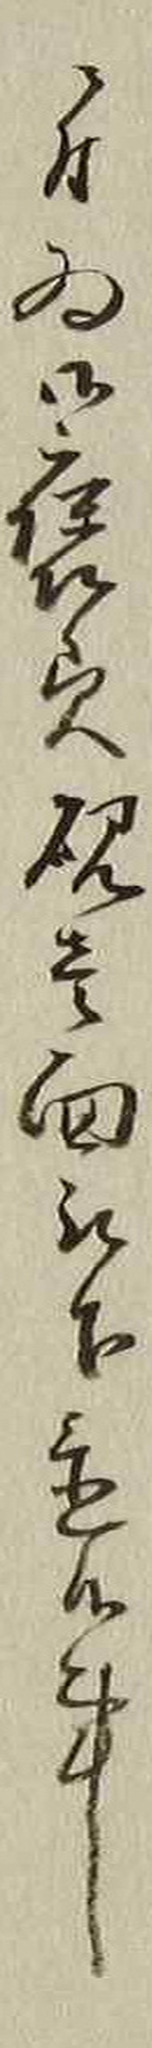ニ付為御褒美硯壱面被下置候事
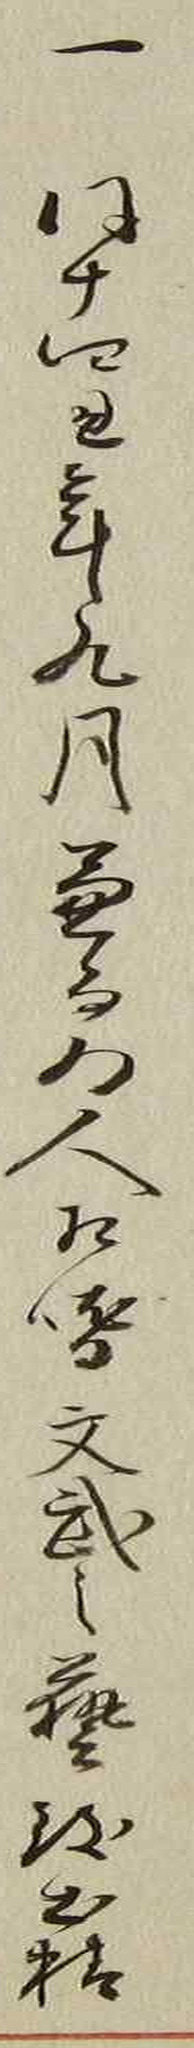一同十四丑年九月兼而為人相嗜文武之芸致出精
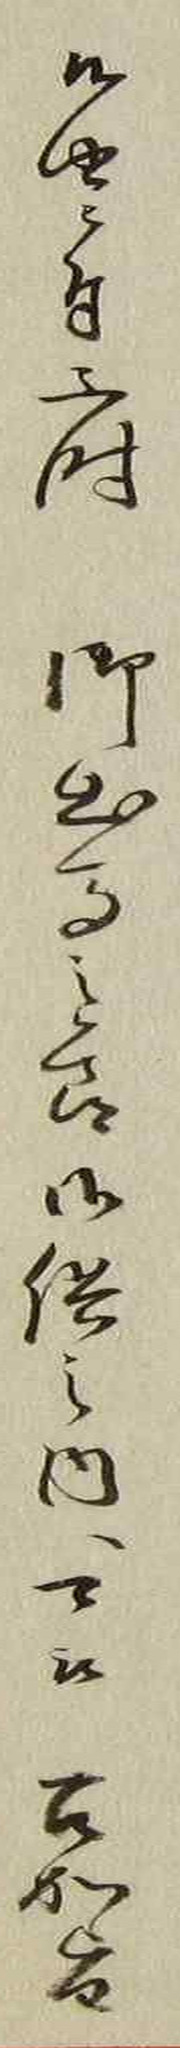候由ニ付不時御出馬之節御供之内へ可被召加旨
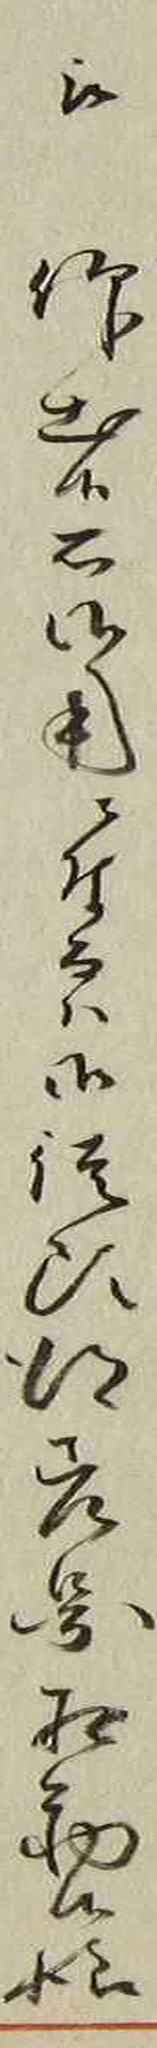被仰出候右御用ニ付而は御徒頭得差図相勤候様
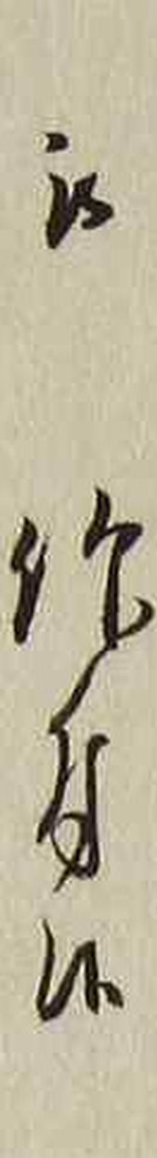被仰付候
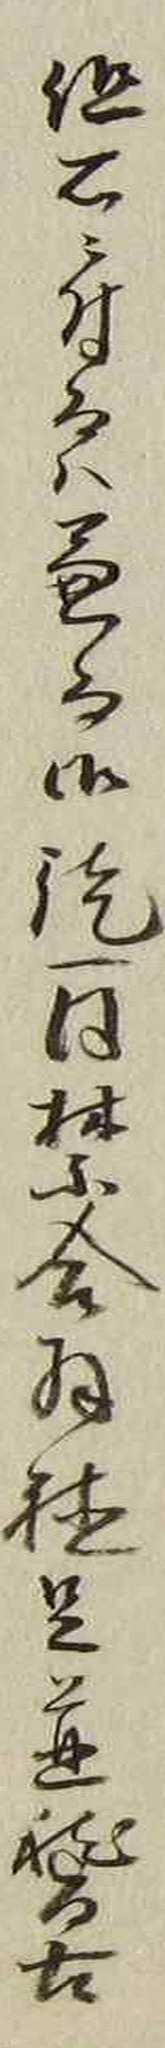但右ニ付而は兼而御徒一同禁合拝聴足並稽古
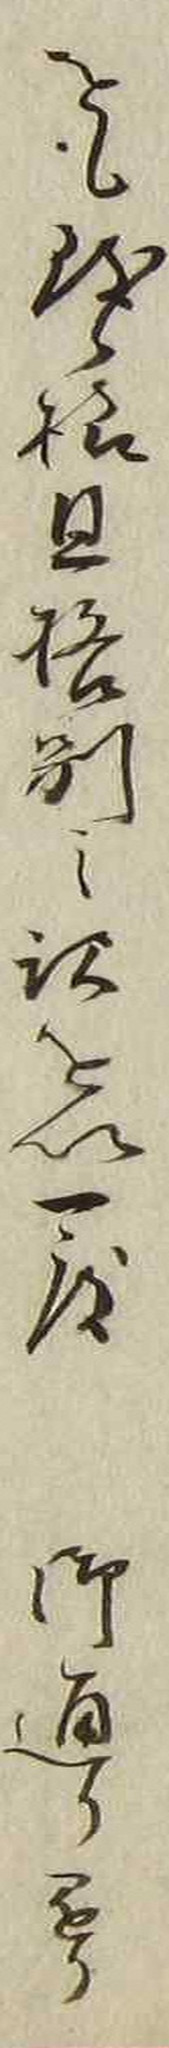をも致候様且格別之訳を以一度御通り懸り

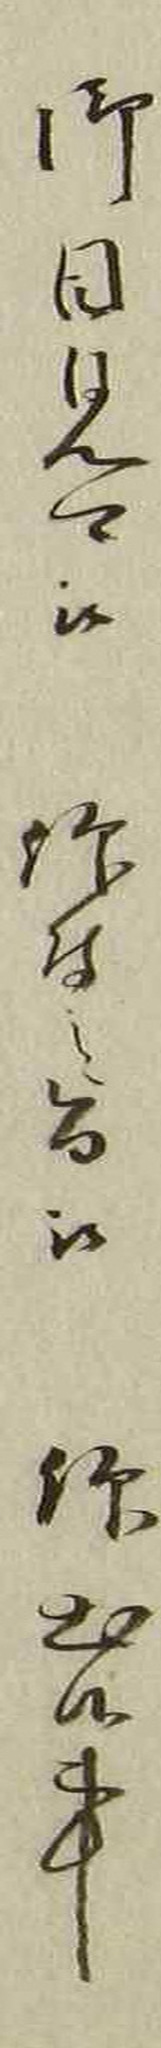御目見可被仰付之旨被仰出候事
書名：諸士系譜　巻之32　い之部32
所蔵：会津若松市立会津図書館
